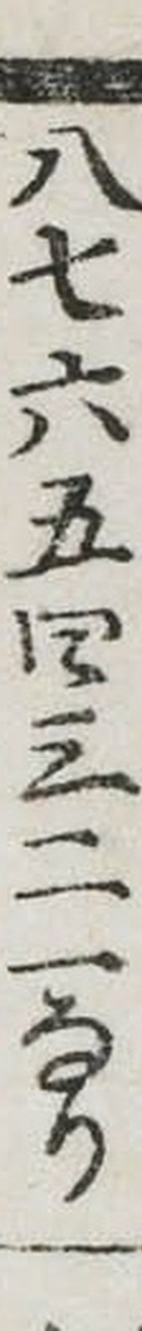八七六五四三二一なり
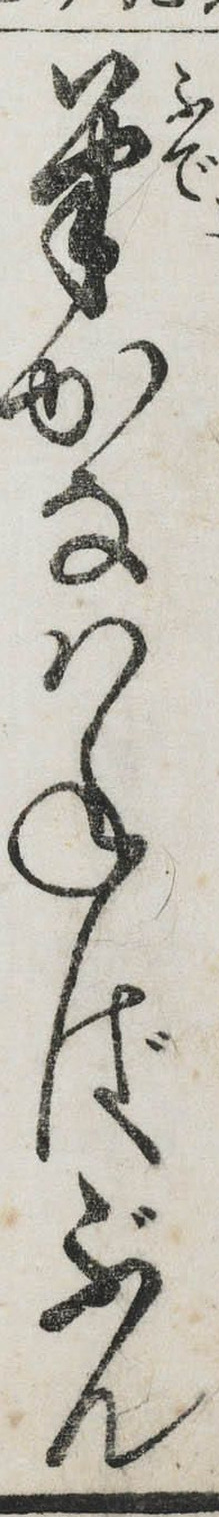筆かなはねばぶん
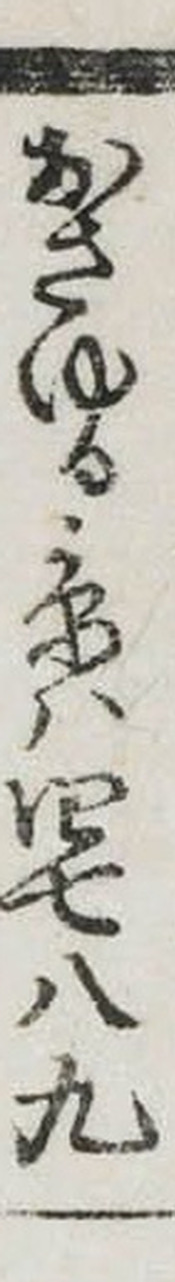おさゆる糸は四七八九
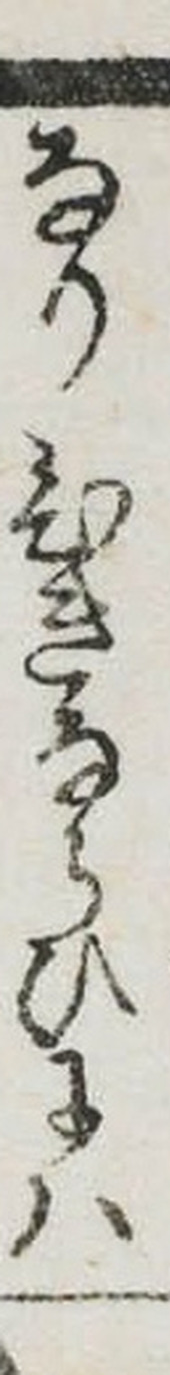なりひきならひには
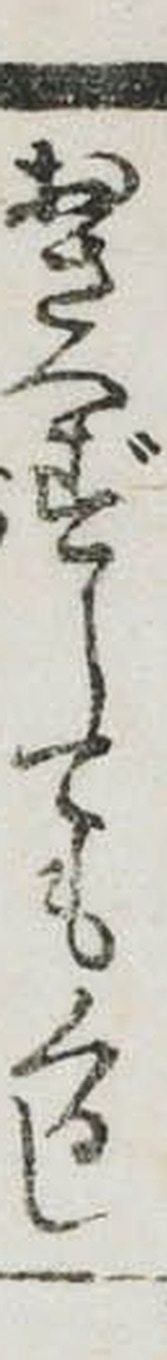おさへずしてもくるし
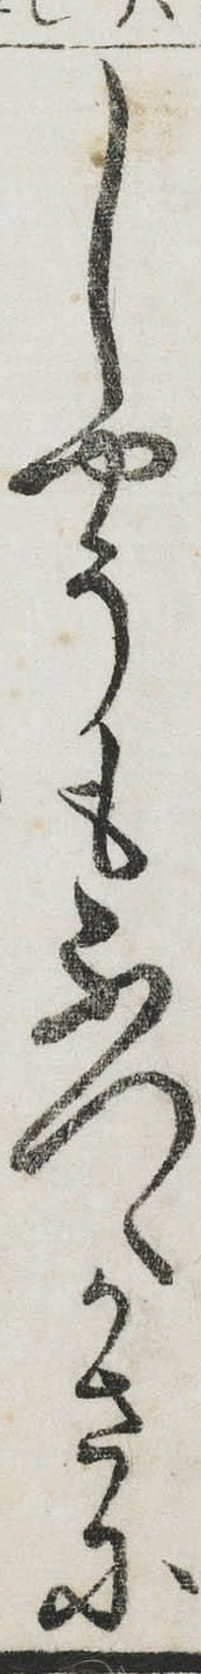しやうもふつゝかさに
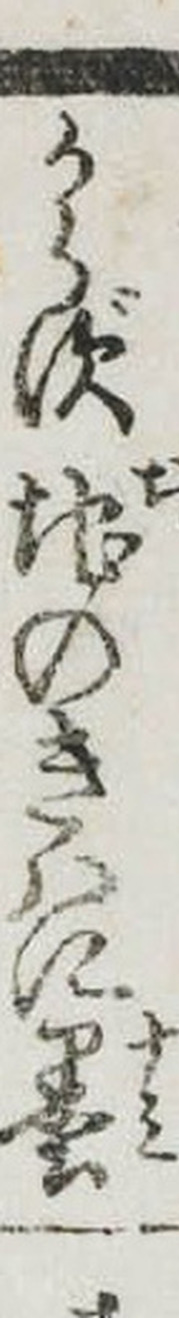からず地のきはに墨
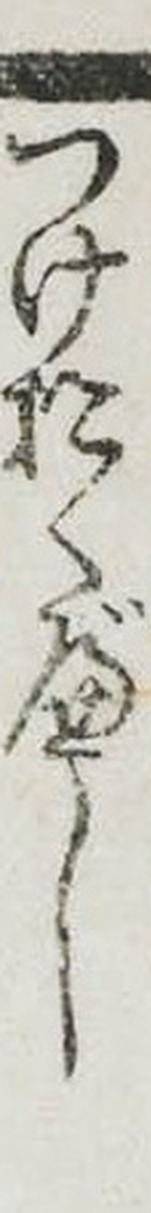つけおくべし
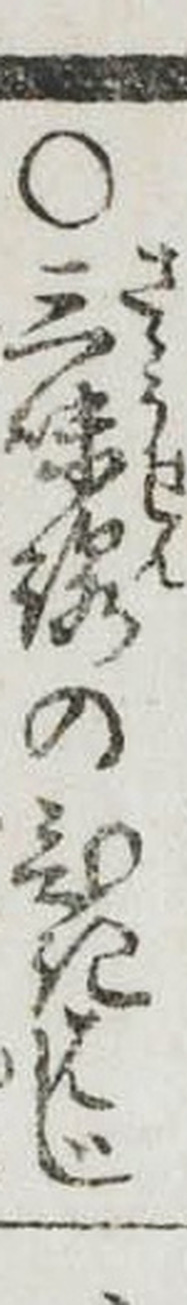○三味線のひきはじ
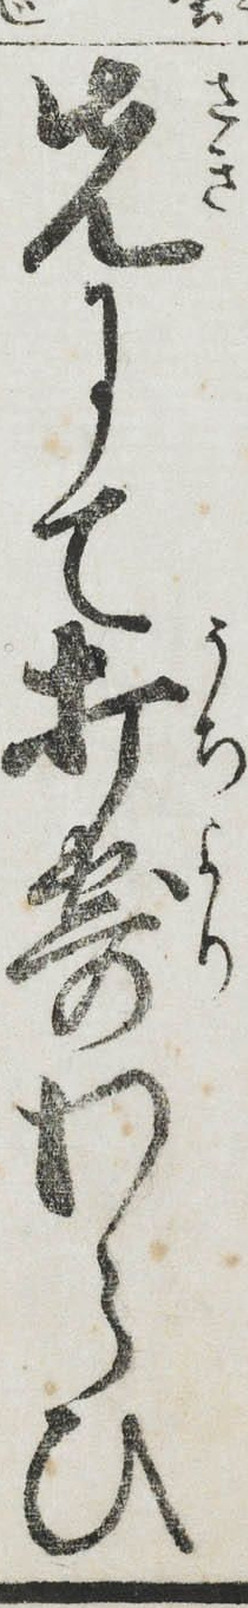先にて打寄わらひ
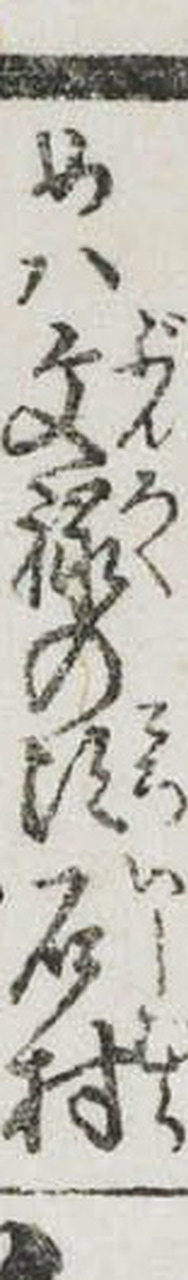めは文禄の頃石村
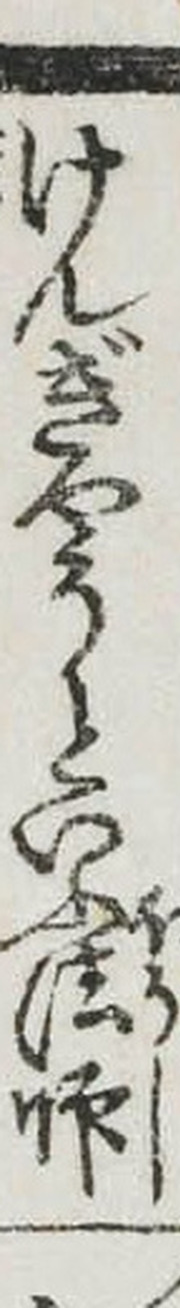けんぎやうといふ法師
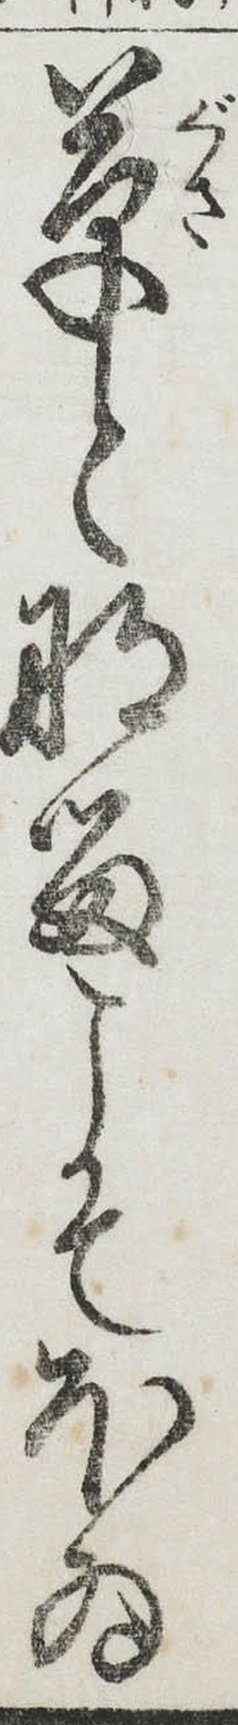草となることそほゐ
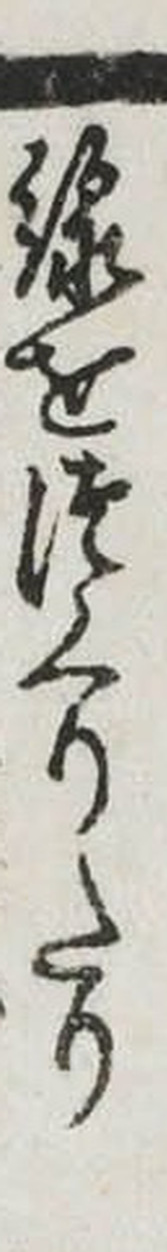線をつくりたり
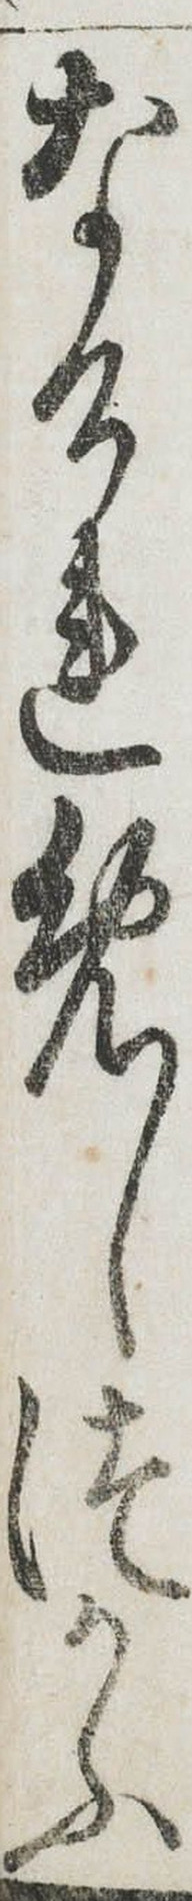なけれめしつかふ
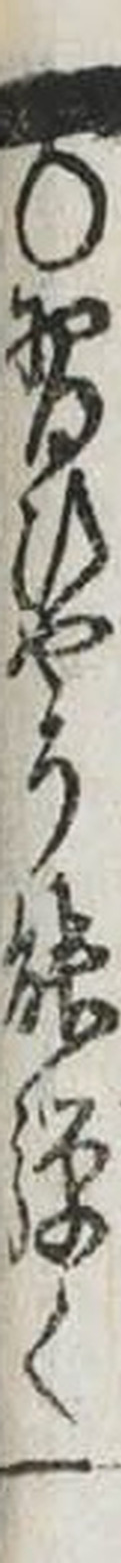○習ひやう能弾く
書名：頭書萬用婦人手紙之文言
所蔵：東京学芸大学教育コンテンツアーカイブ
